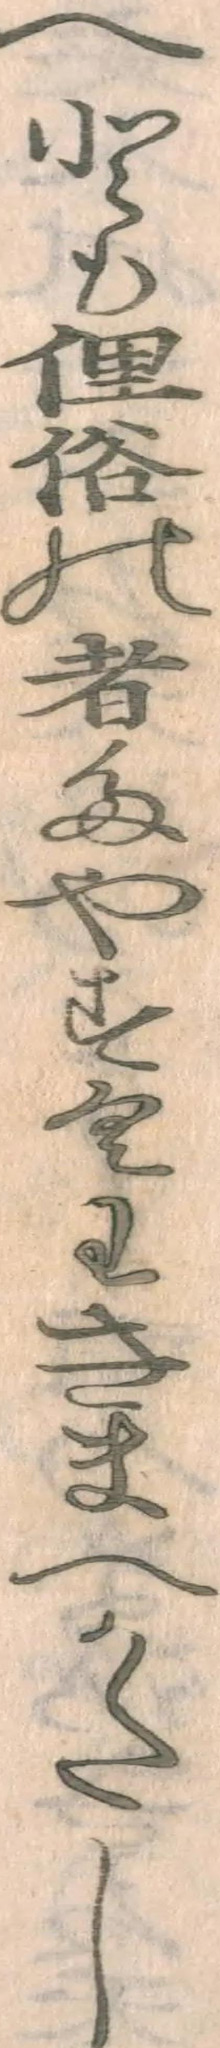へとも俚俗の者たやすくわきまへかたし
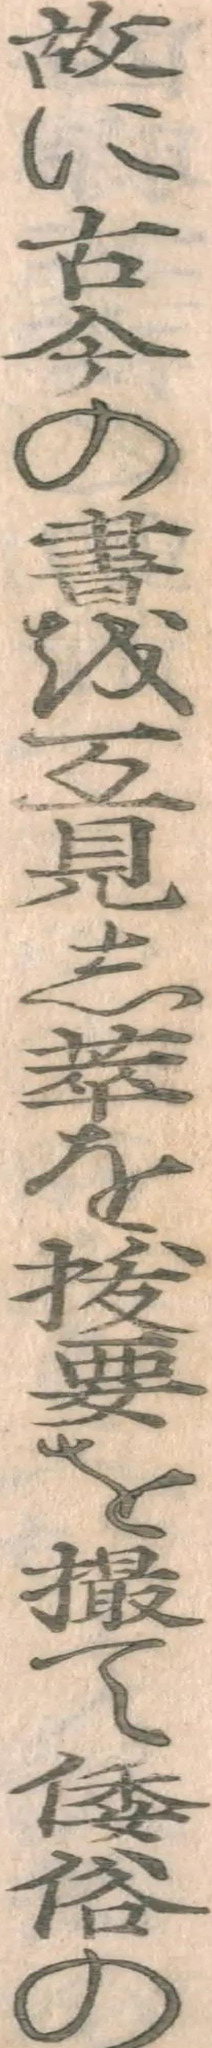故に古今の書を互見し萃を抜要を撮て倭俗の
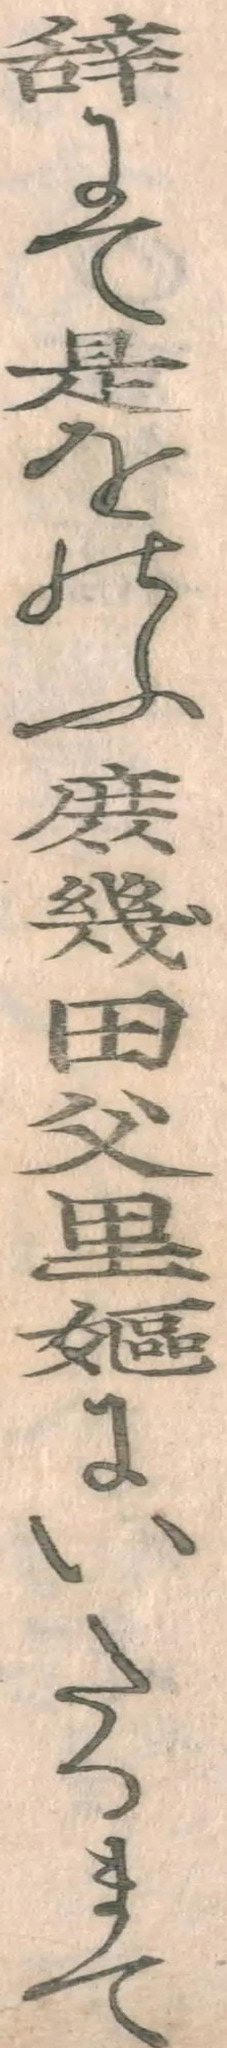辞にて是をのふ庶幾田父里嫗にいたるまて
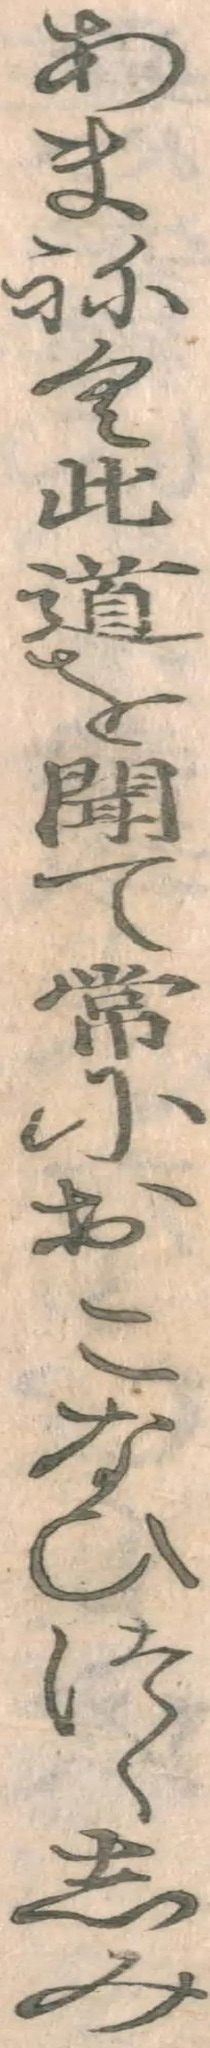あまねく此道を聞て常におこなひつヽしみ

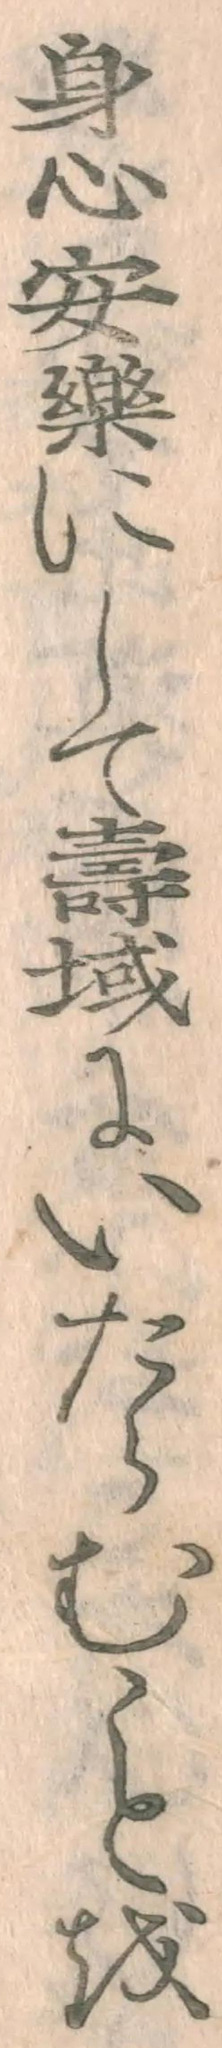身心安楽にして寿域にいたらむことを
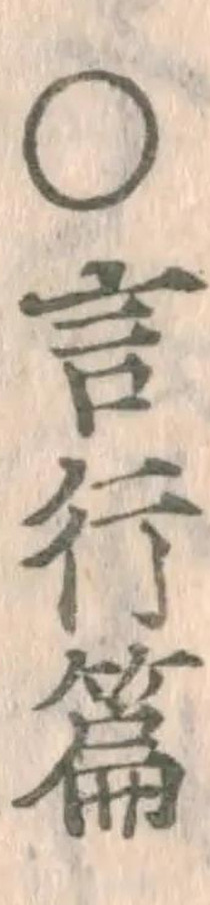〇言行篇
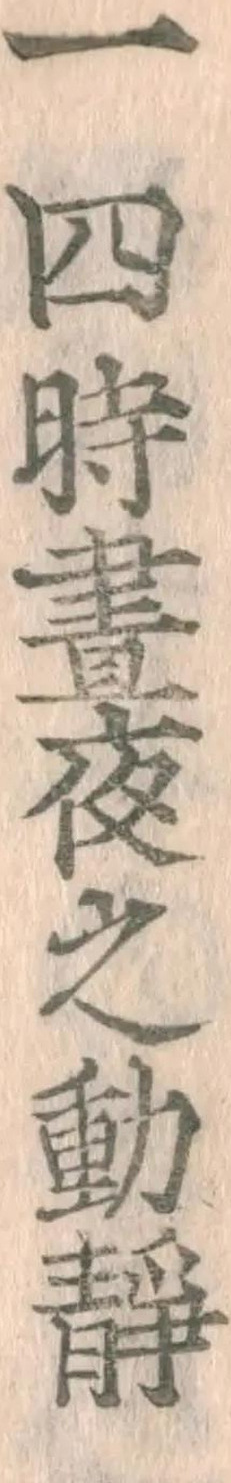一四時昼夜の動静
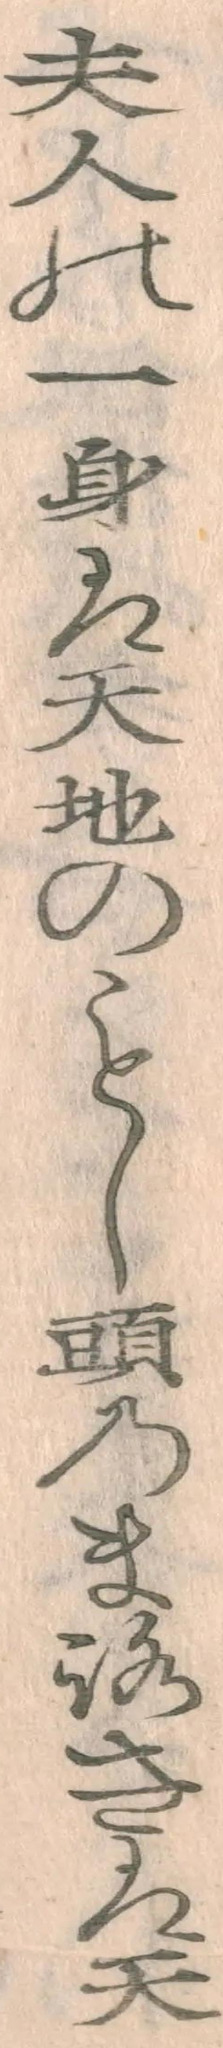夫人の一身は天地のことし頭のまろきは天
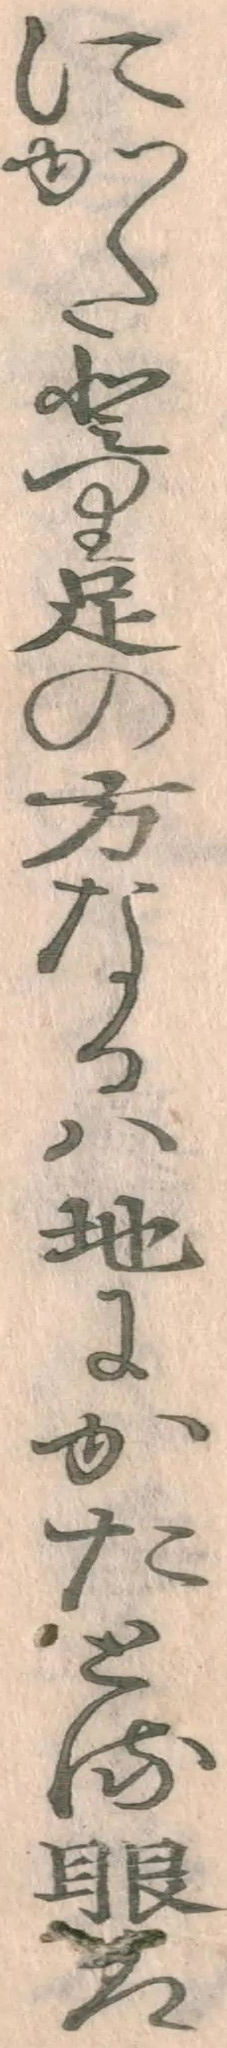にかたとり足の方なるは地にかたとる眼は
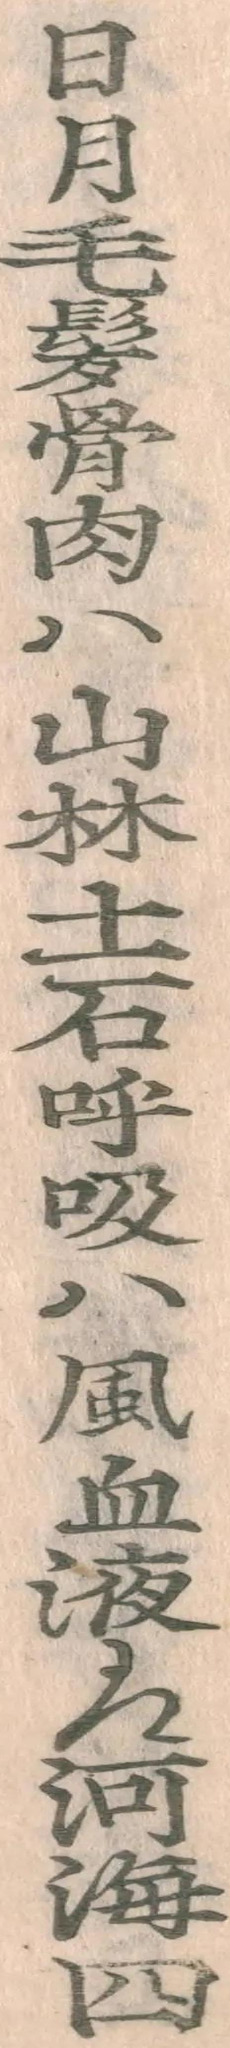日月毛髪骨肉は山林土石呼吸は風血液は河海四
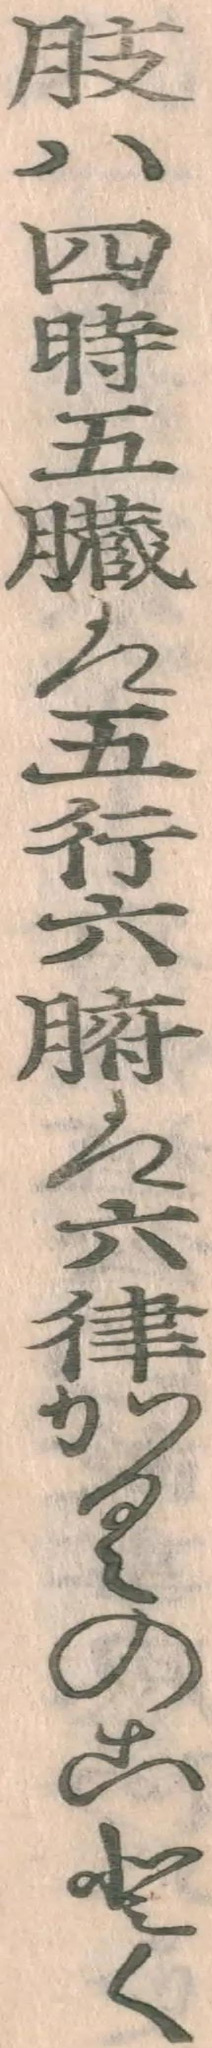肢は四時五臓は五行六腑は六律かくのことく
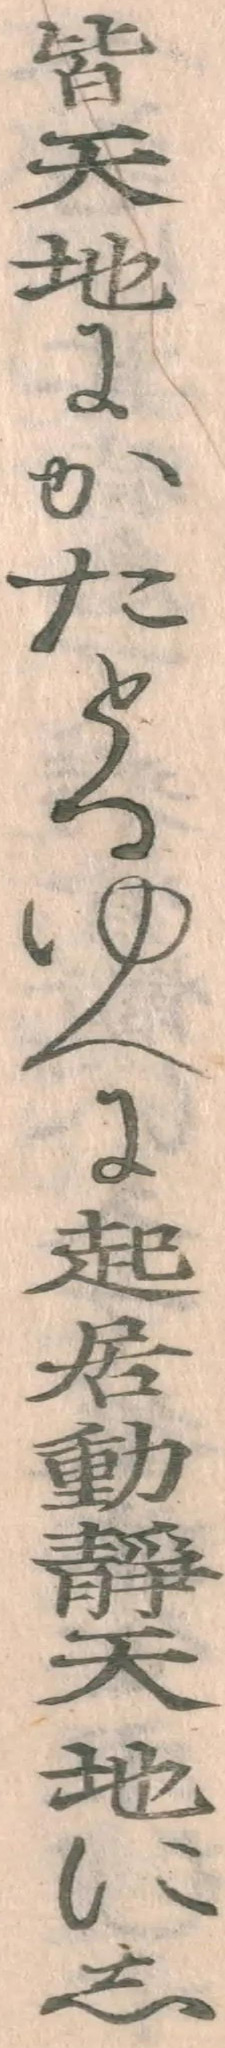皆天地かたとるゆへに起居動静天地にし
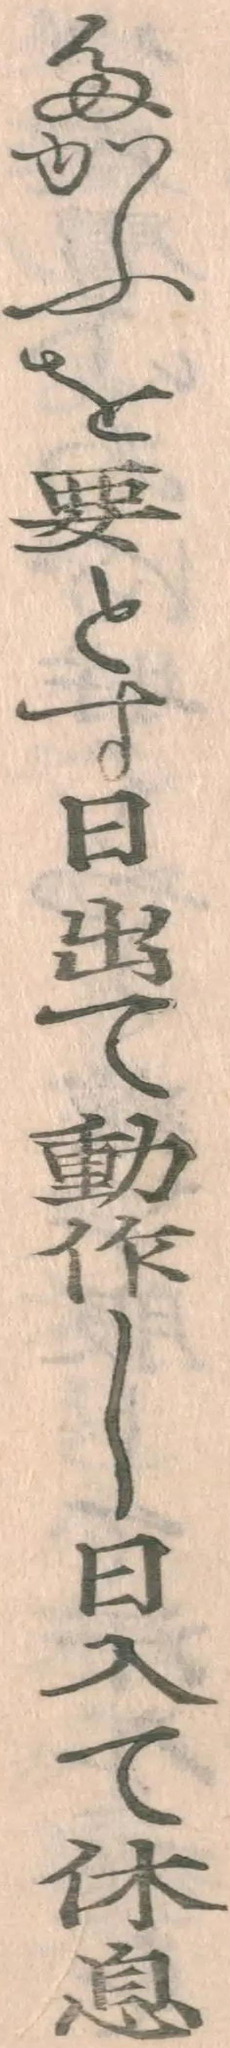たかふを要とす日出て動作し日入て休息
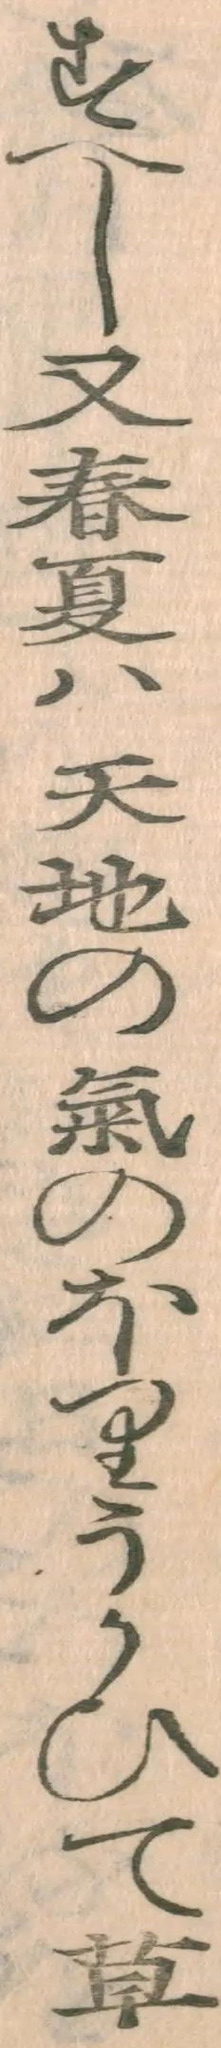すへし又春夏は天地の気のほりうかひて草
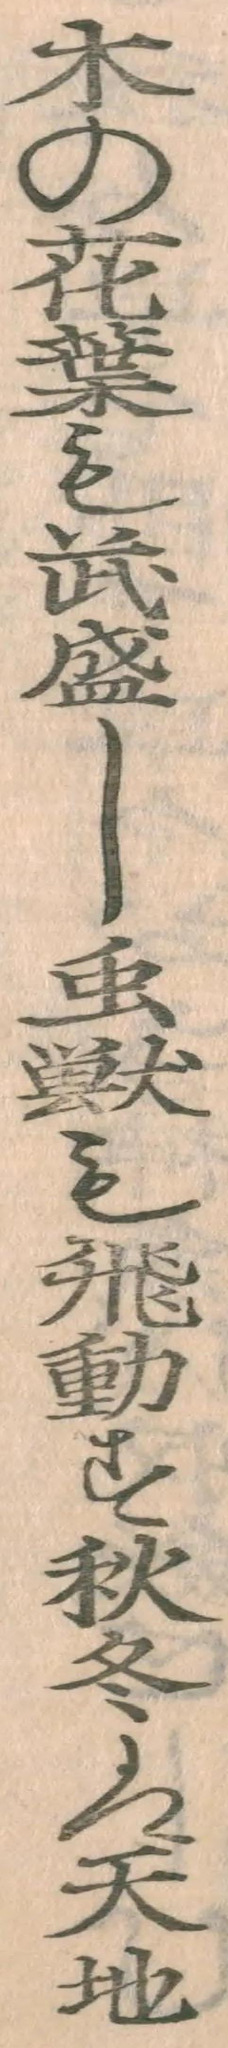木の花葉も武盛し虫獣も飛動す秋冬は天地
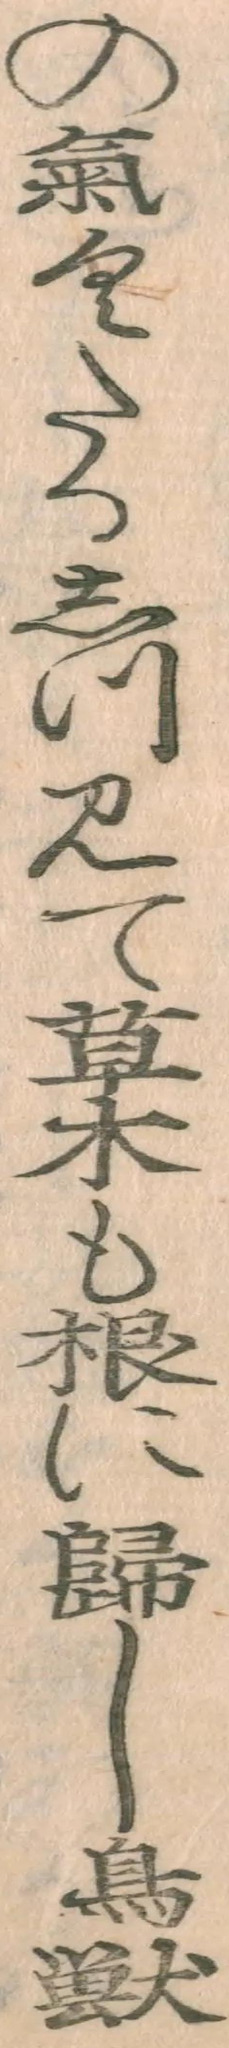の気くたりしつみて草木も根に帰し鳥獣
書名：延壽撮要
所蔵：国立国会図書館 National Diet Library, JAPAN
